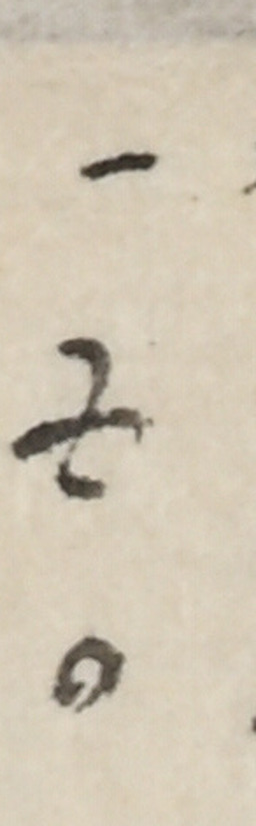廿五日
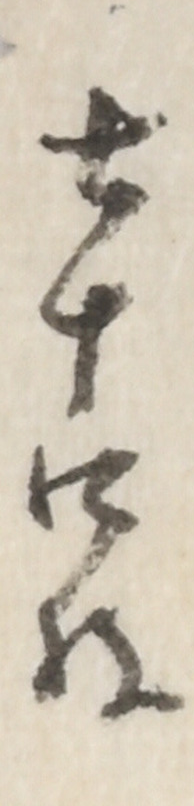六十四枚
